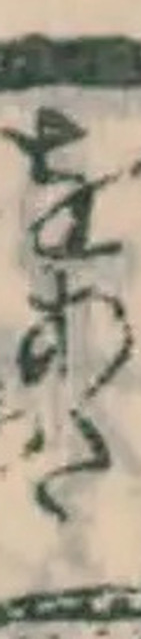をあた
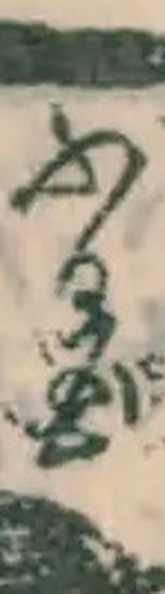ふる図
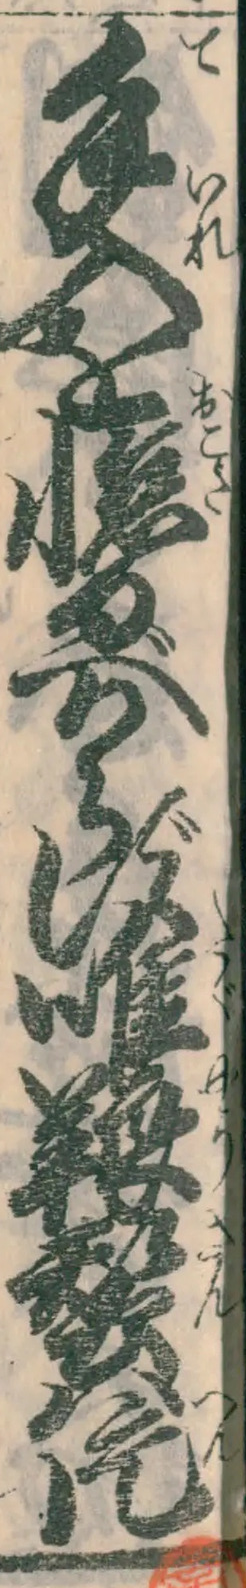手入を惰るべからず唯養蚕は片
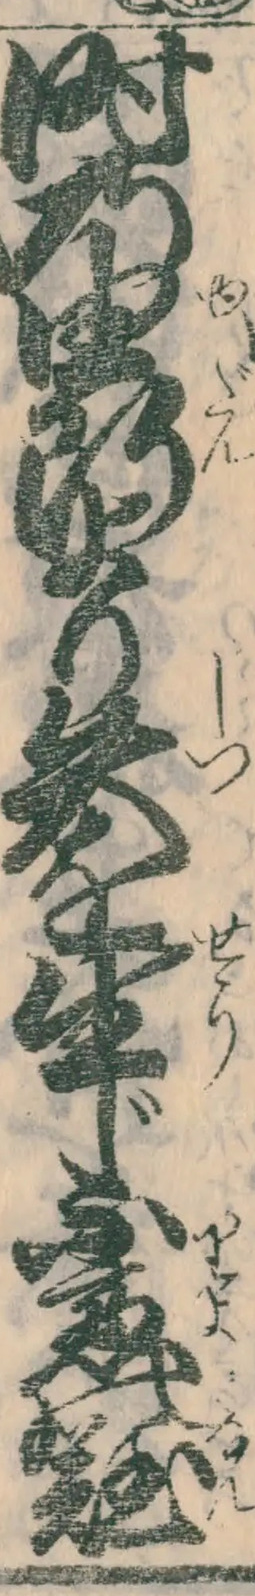時の油断より失を生じ不慮の難
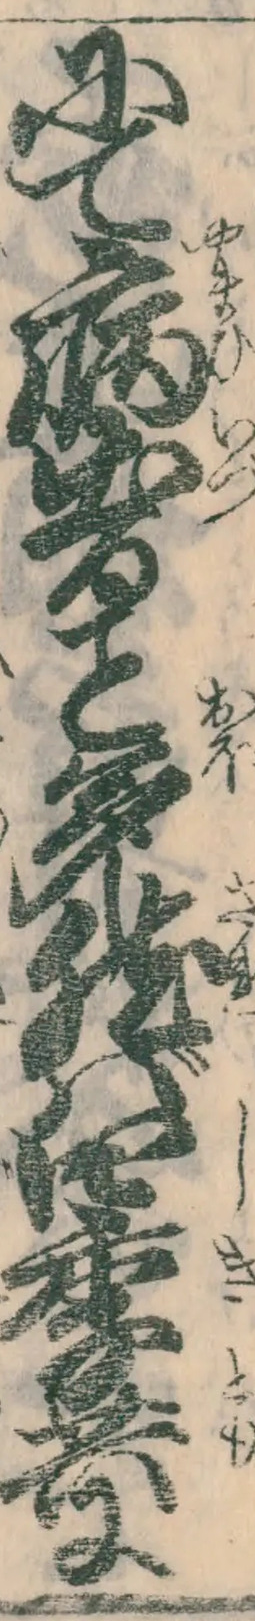にて病出ること多し然ば四季共に
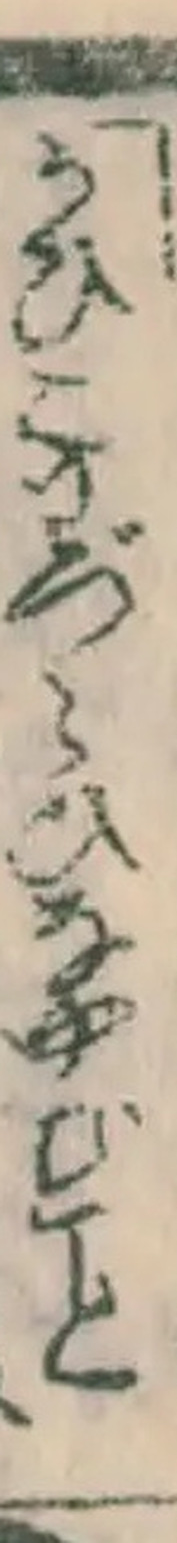「かひこわづらひなやむこと
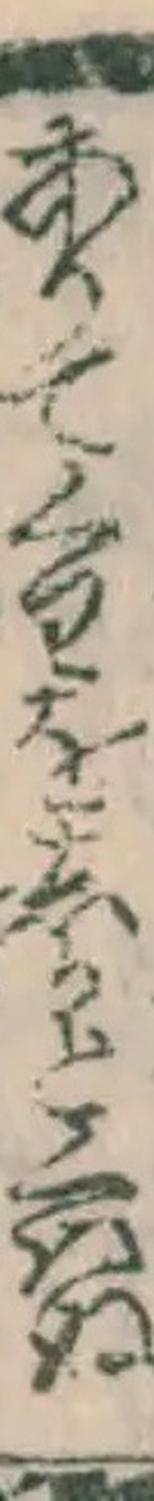ありてくわをしかとくはぬ
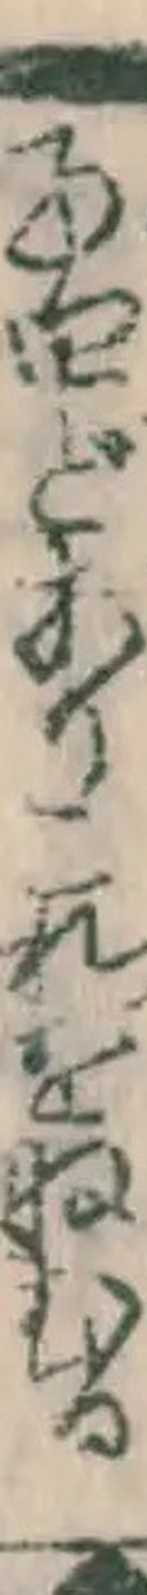事四どありこれをねむる
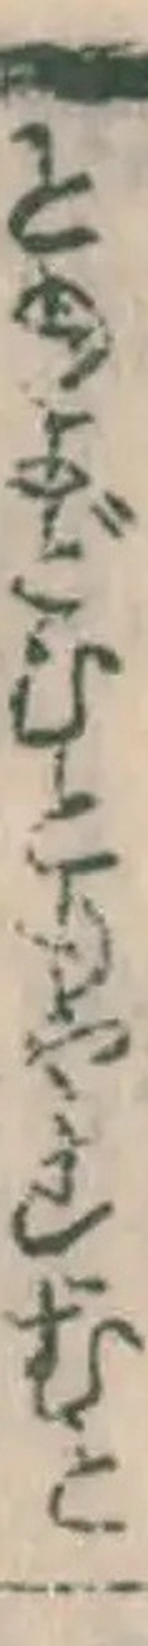ともよどむともやすむと
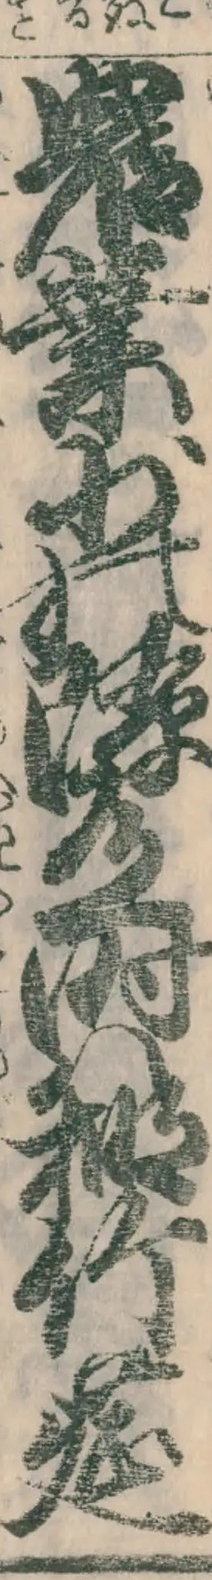農業少の隙有時は棚竹筵
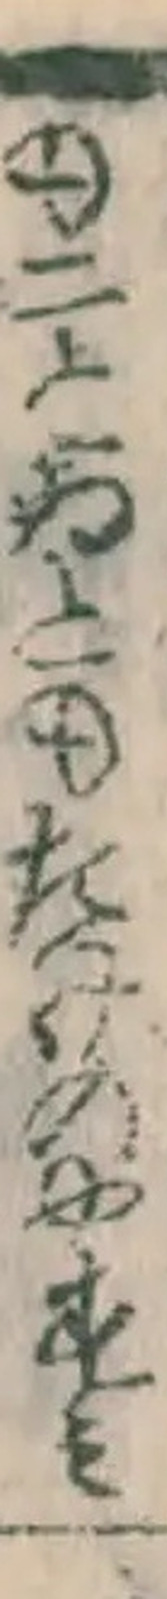も二とゐともたけのやすみ
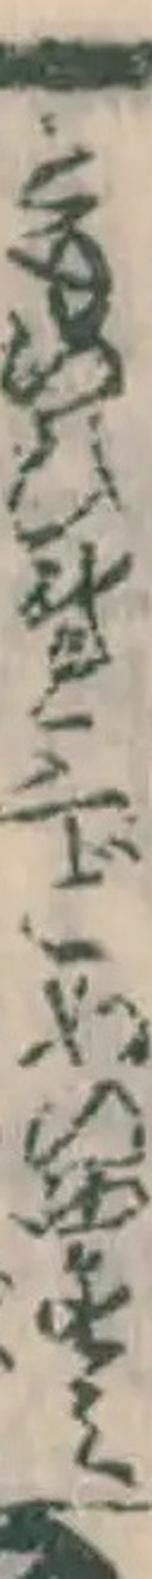ともいひ第三どめのやすみ
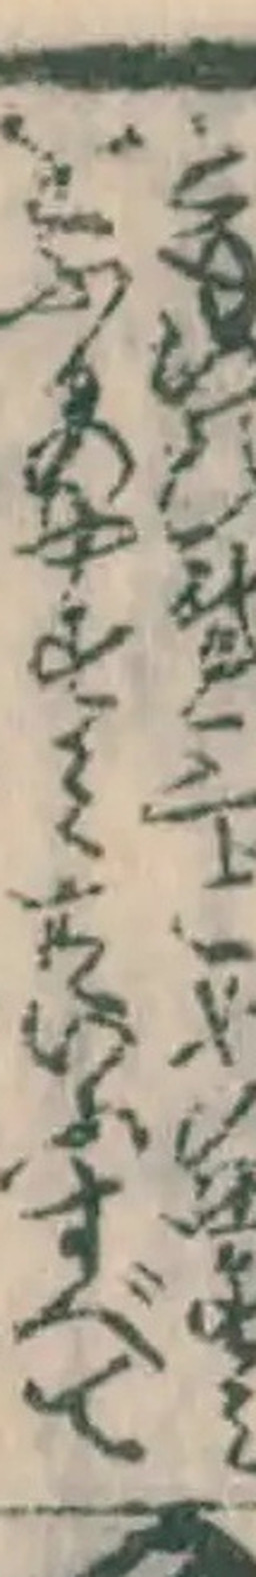をふるのやすみ共いふすべて
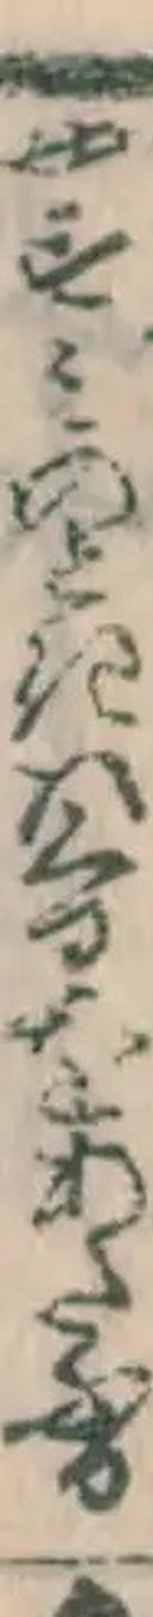やすみのときはくわをあたふる
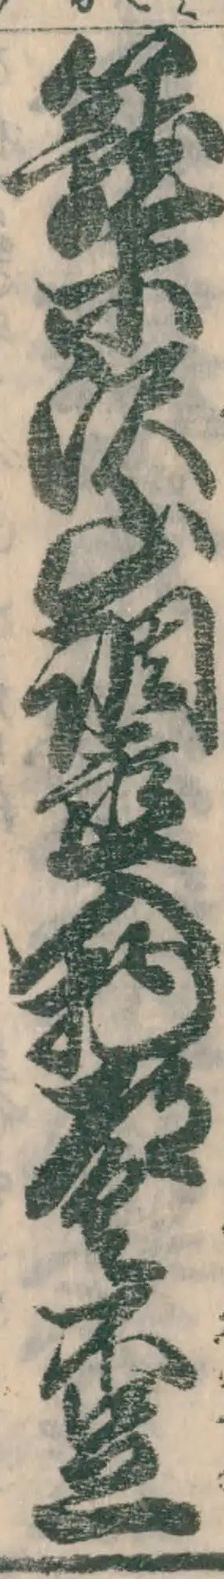籠等沢山調置入物道具不足

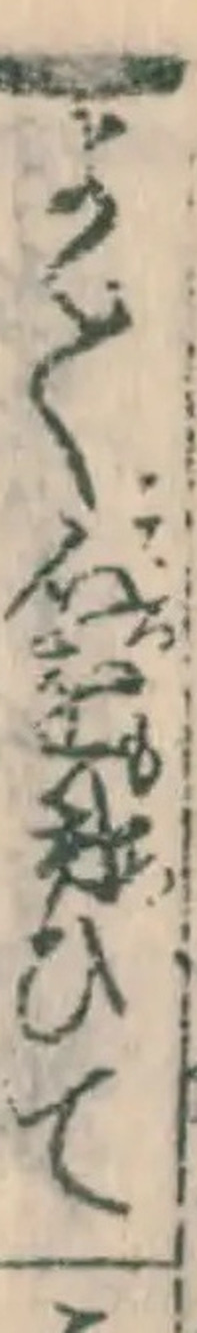よく〳〵心を用ひて
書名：養蚕往来
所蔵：国立国会図書館 National Diet Library, JAPAN
